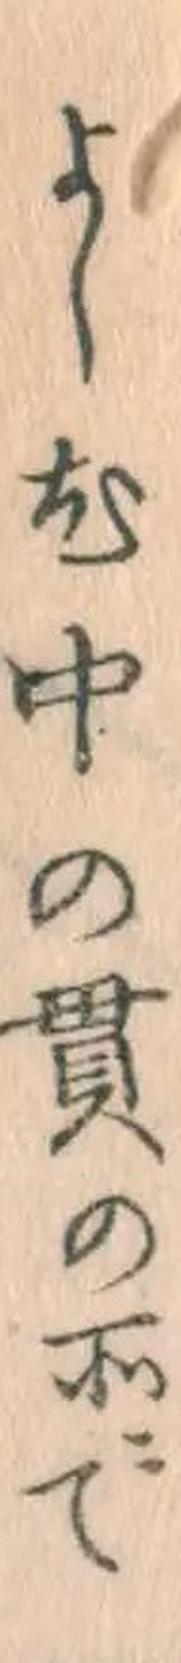よし尤中の貫の所にて
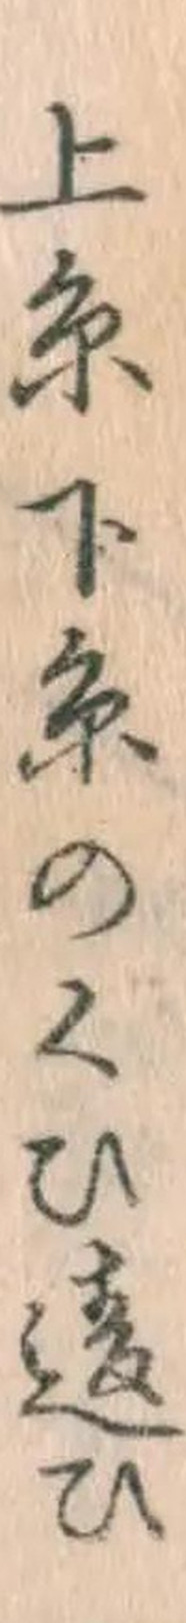上糸下糸のくひ違ひ
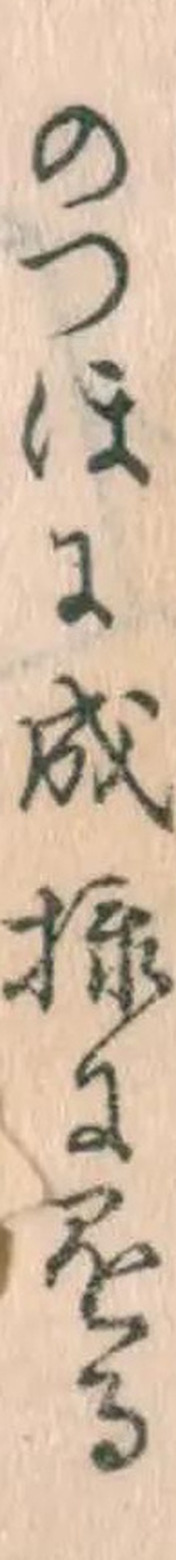のつほに成様に懸る
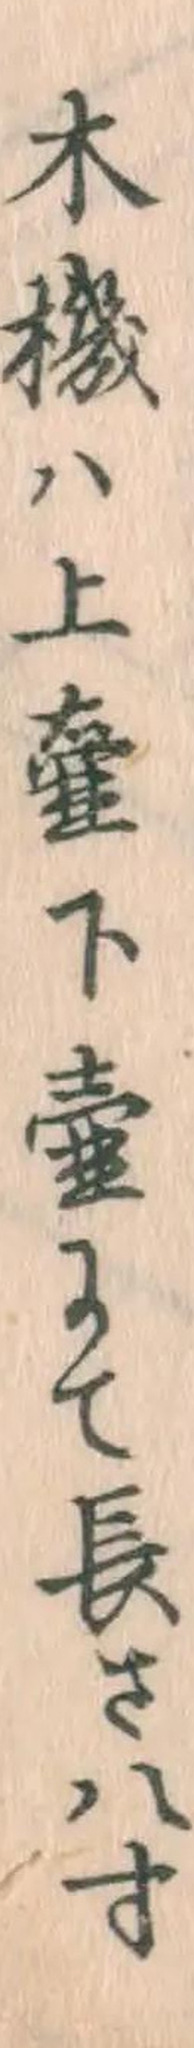木機は上壺下壺にて長さ八寸
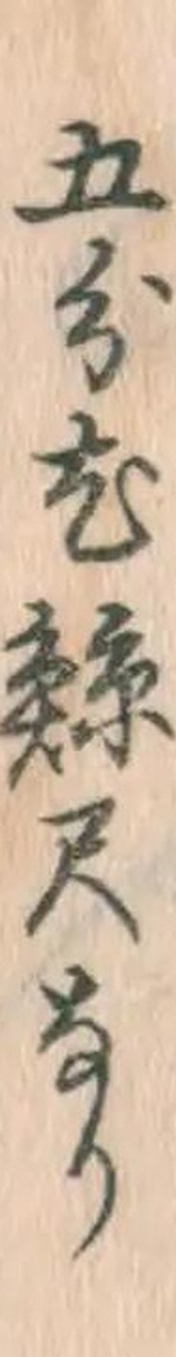五分尤鯨尺なり
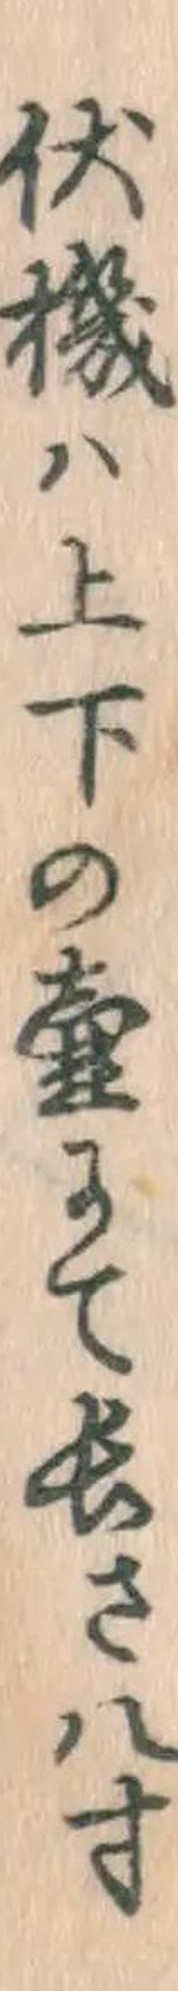伏機は上下の壺にて長さ八寸

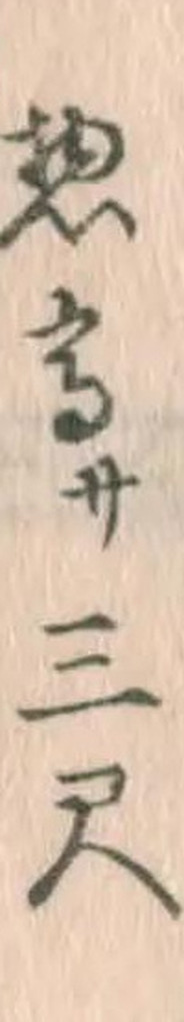惣高サ三尺
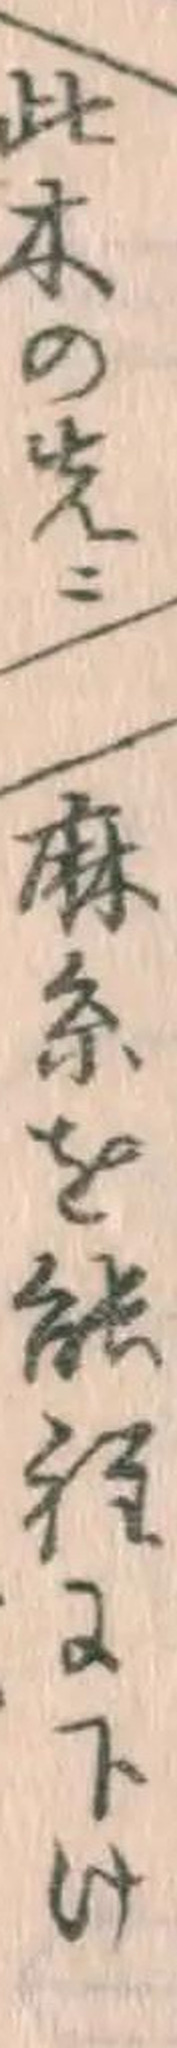此木の先に麻糸を能程に下け
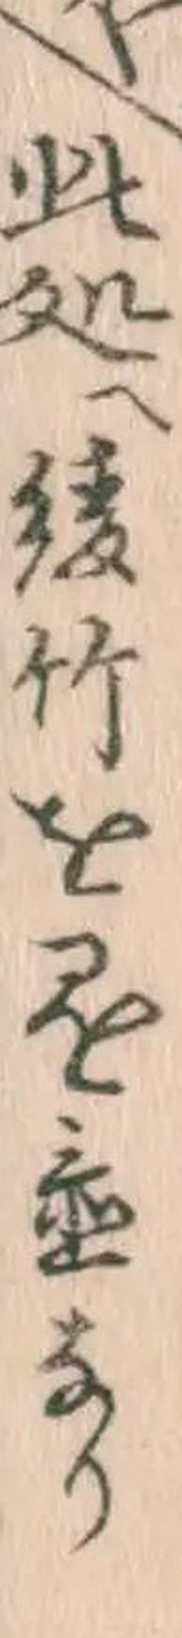此処へ綾丈を懸置なり
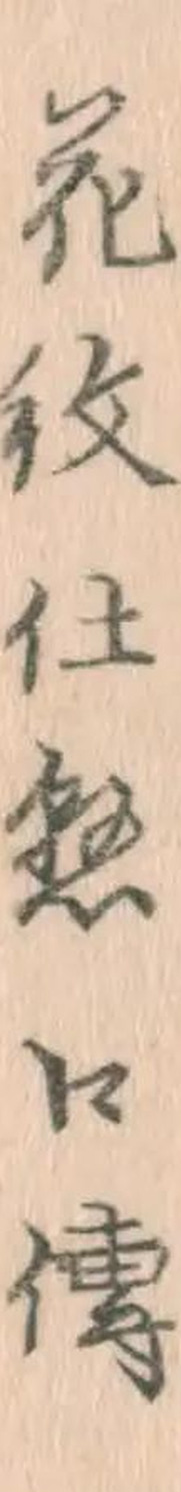花紋仕懸口伝
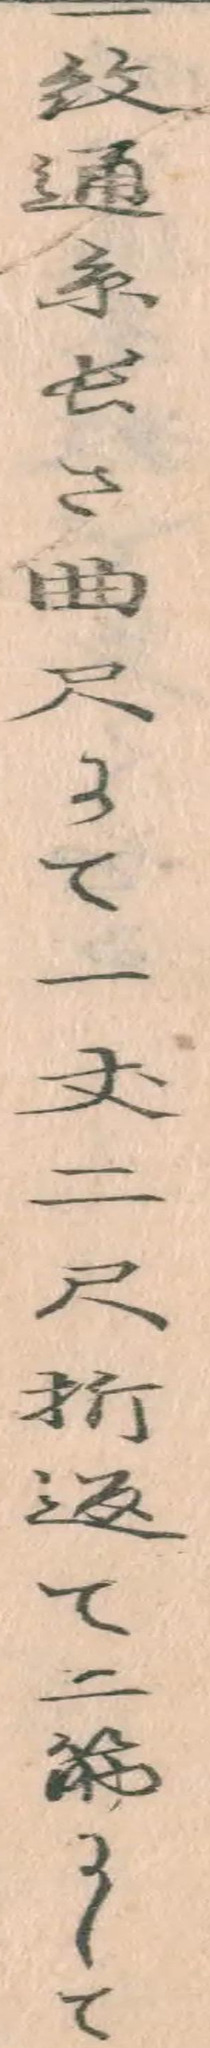一紋通糸長さ曲尺にて一丈二尺折返て二筋にして
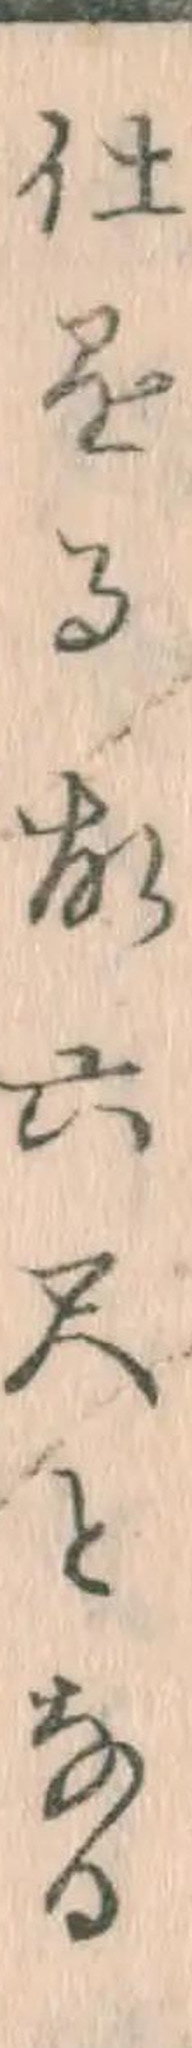仕懸る故六尺となる
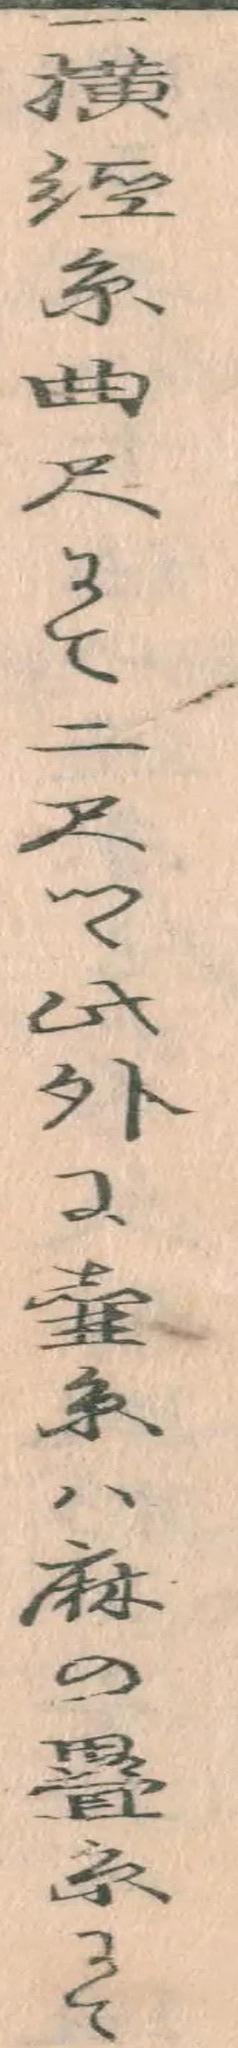一横経糸曲尺にて二尺つゝ此外に壺糸は麻の畳糸にて
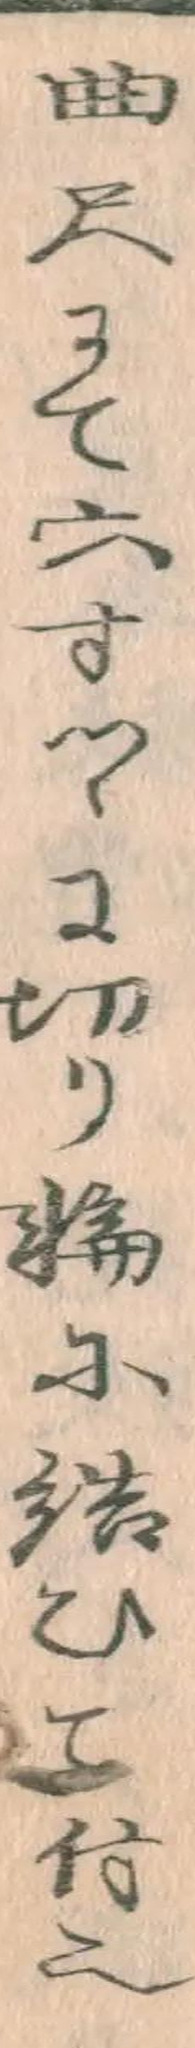曲尺にて六寸つゝに切り輪に結ひて付也
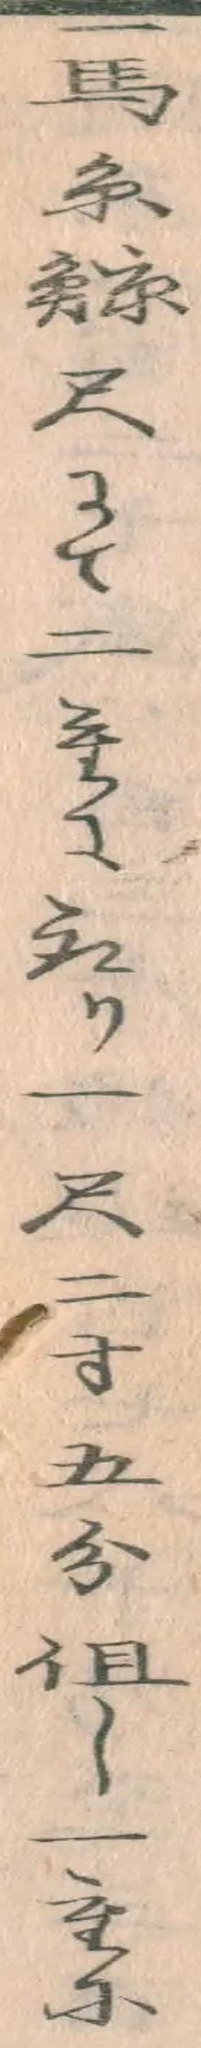一馬糸鯨尺にて二重に取り一尺二寸五分但し一重に
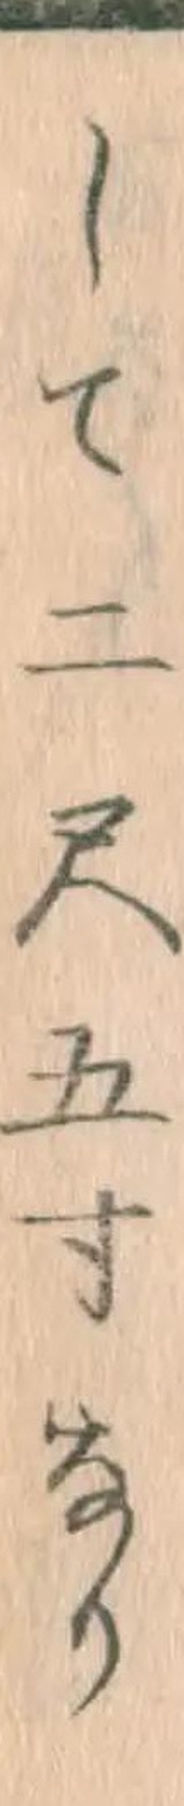して二尺五寸なり
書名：機織彙編 5巻. [2]
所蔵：国立国会図書館 National Diet Library, JAPAN
